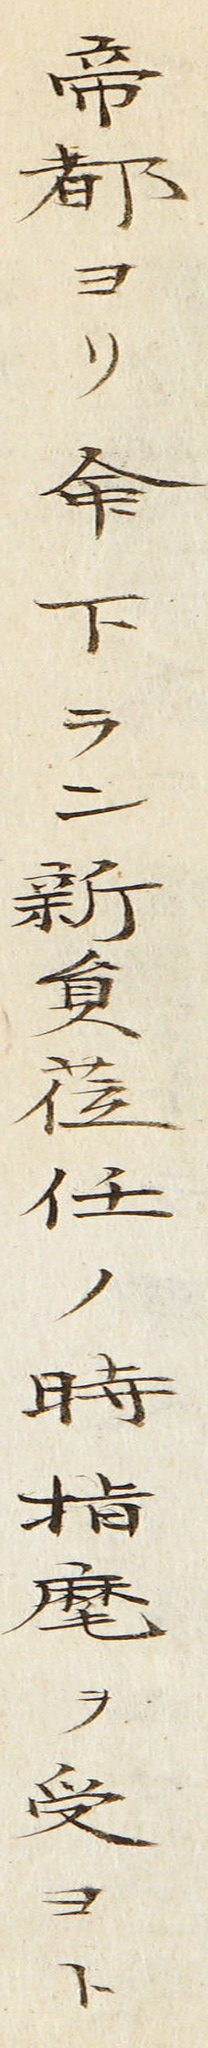帝都ヨリ命下ラン新員莅任ノ時指麾ヲ受ヨト
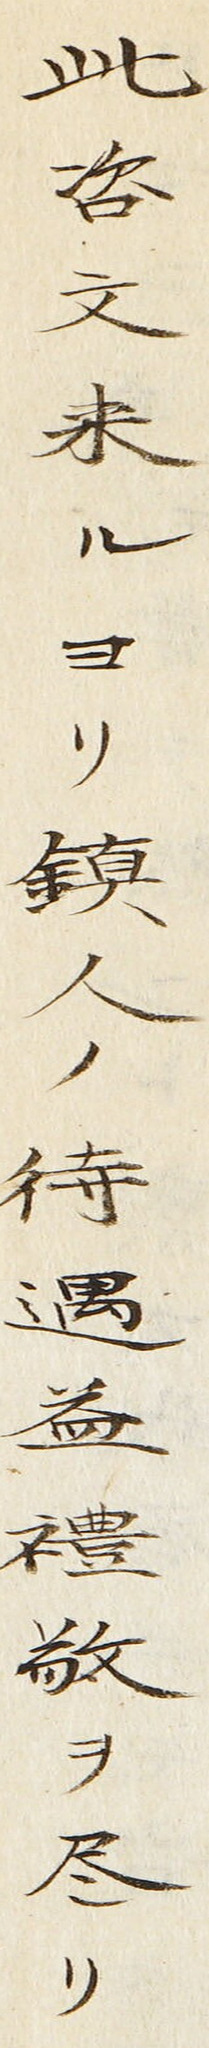此咨文来ルヨリ鎮人ノ待遇益礼敬ヲ尽リ
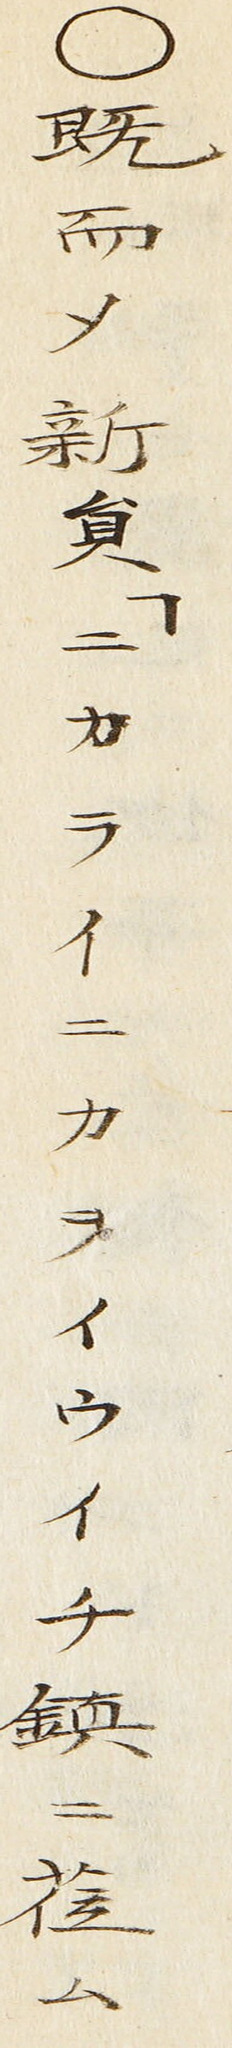○既而シテ新員「ニカライニカヲイウイチ鎮ニ莅ム
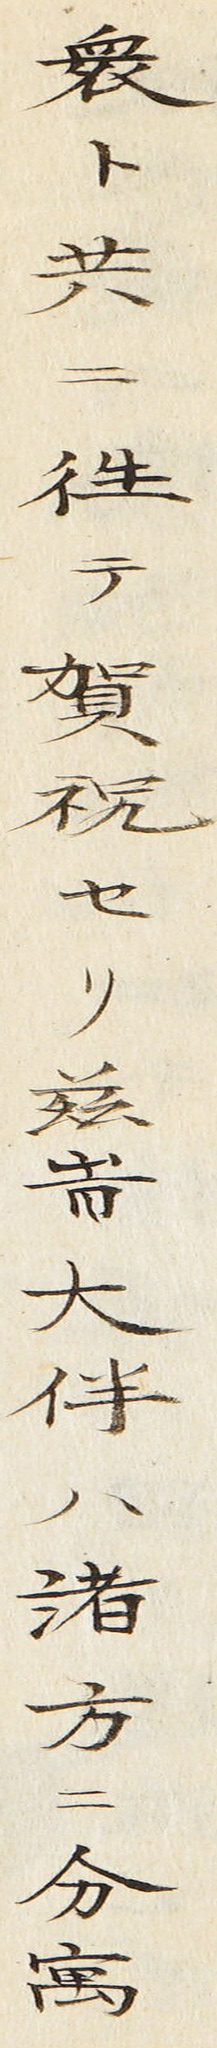衆ト共ニ往テ賀祝セリ茲旹大伴ハ諸方ニ分寓
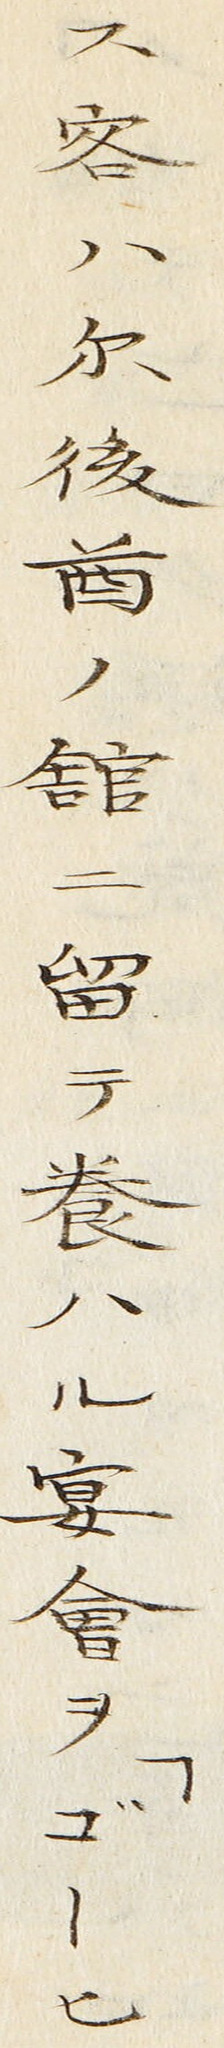ス客ハ尓後酋ノ館ニ留テ養ハル宴会ヲ「ゴーヒ
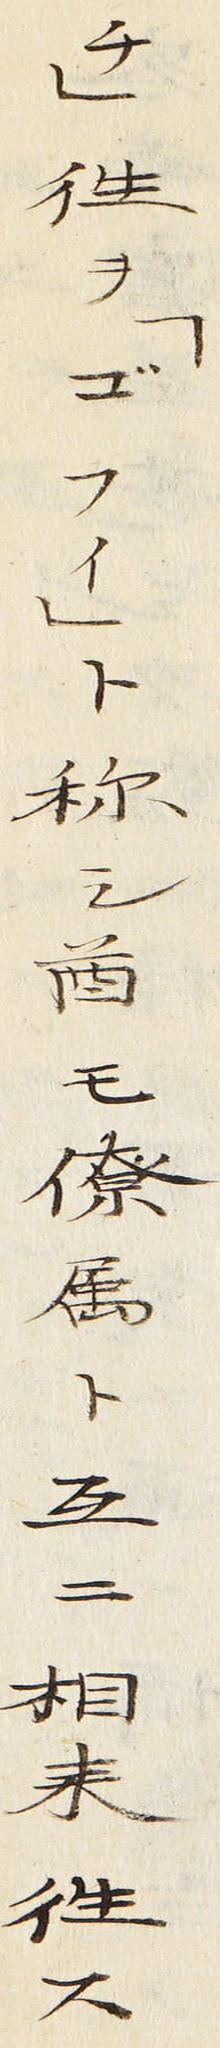チ」往ヲ「ゴフイ」ト称シ酋モ僚属ト互ニ相来往ス
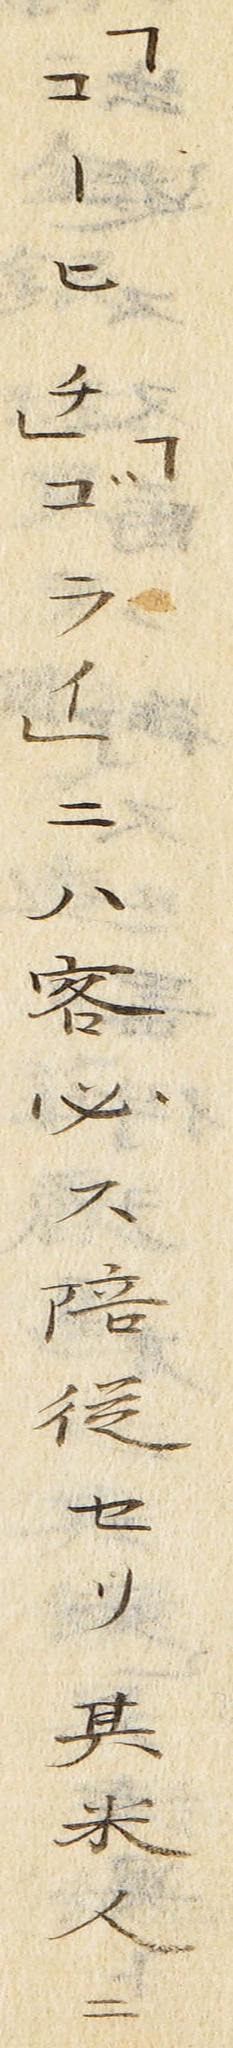「コーヒチ」「ゴライ」ニハ客必ス陪従セリ其米人ニ
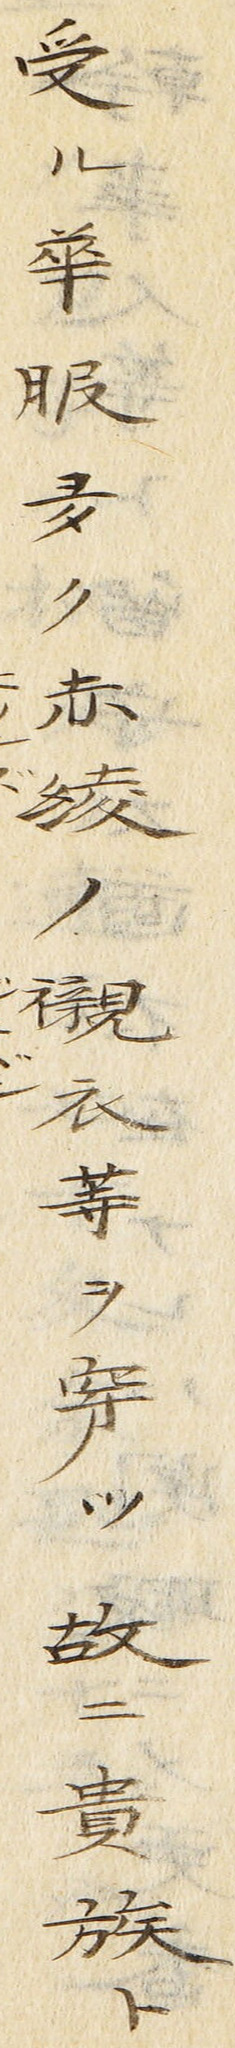受ル華服多ク赤綾ノ襯衣等ヲ穿ツ故ニ貴族ト
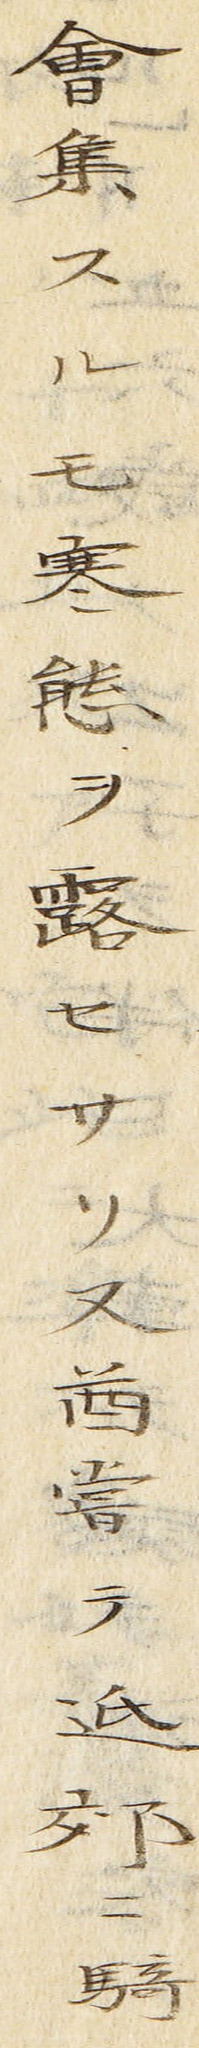会集スルモ寒態ヲ露セサリ又酋嘗テ近郊ニ騎
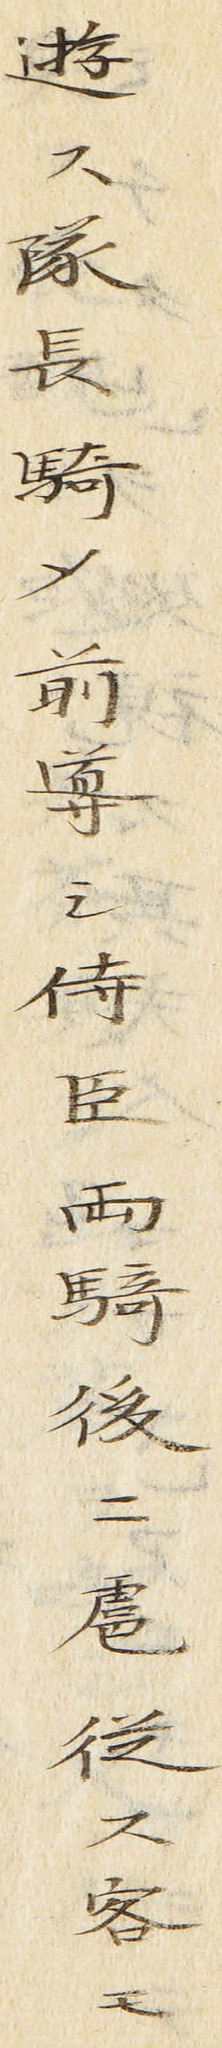遊ス隊長騎シテ前導シ侍臣両騎後ニ扈従ス客モ
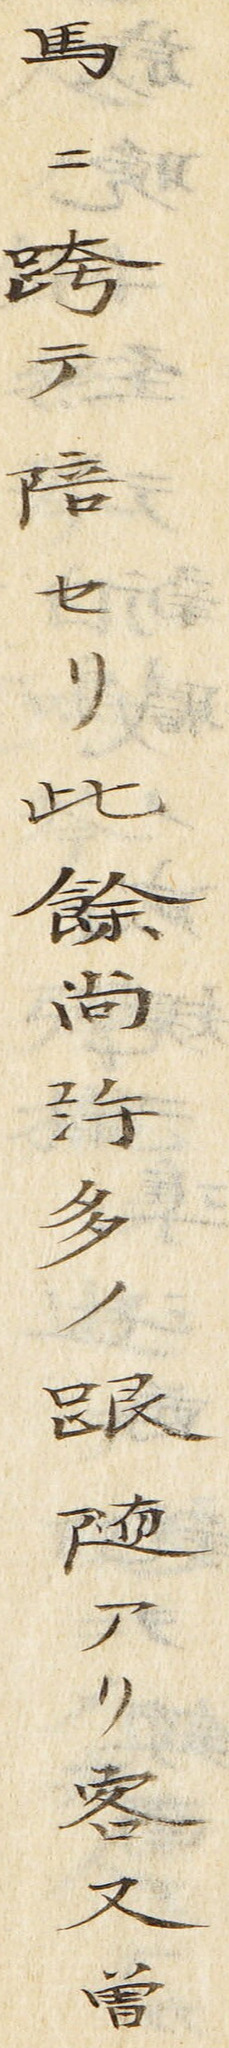馬ニ跨テ陪セリ此余尚許多ノ跟随アリ客又曽
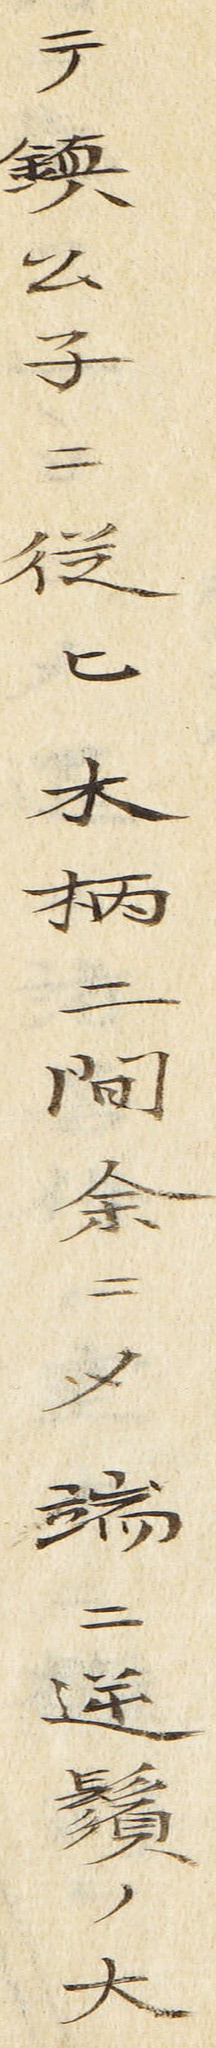テ鎮公子ニ従ヒ木柄二間余ニシテ端ニ逆鬚ノ大
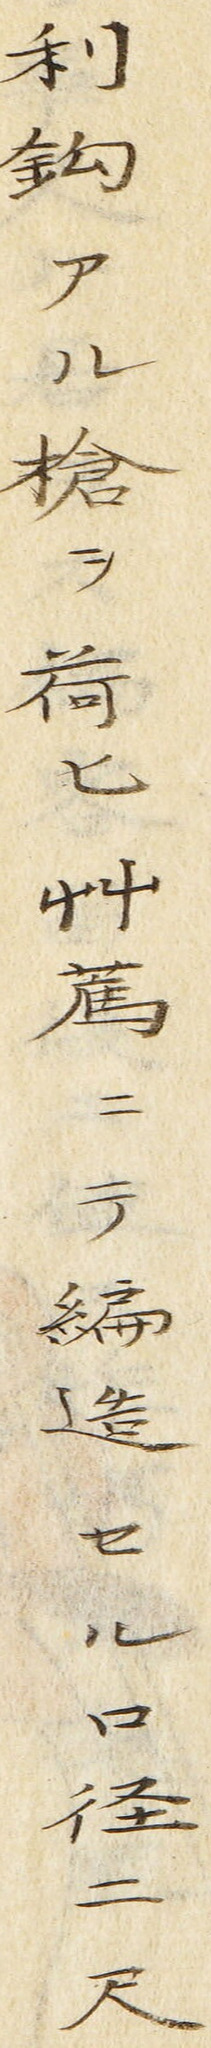利鈎アル槍ヲ荷ヒ艸薦ニテ編造セル口径二尺
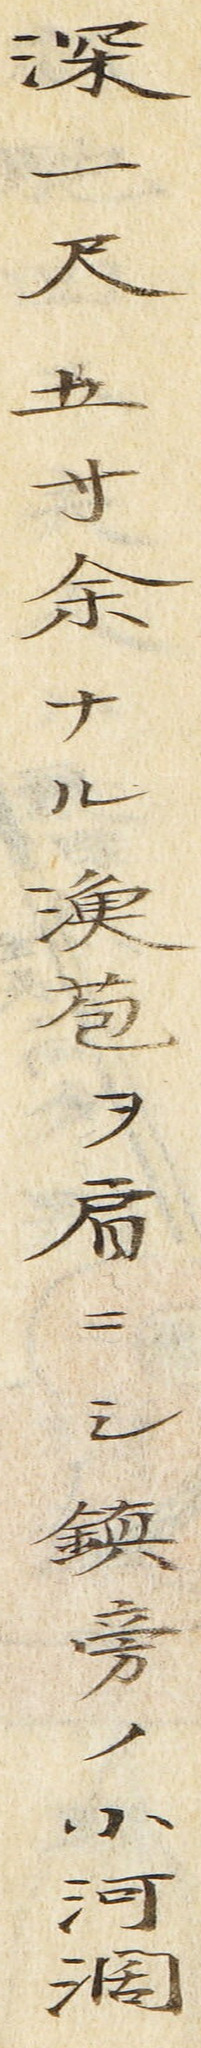深一尺五寸余ナル漁苞ヲ肩ニシ鎮旁ノ小河濶
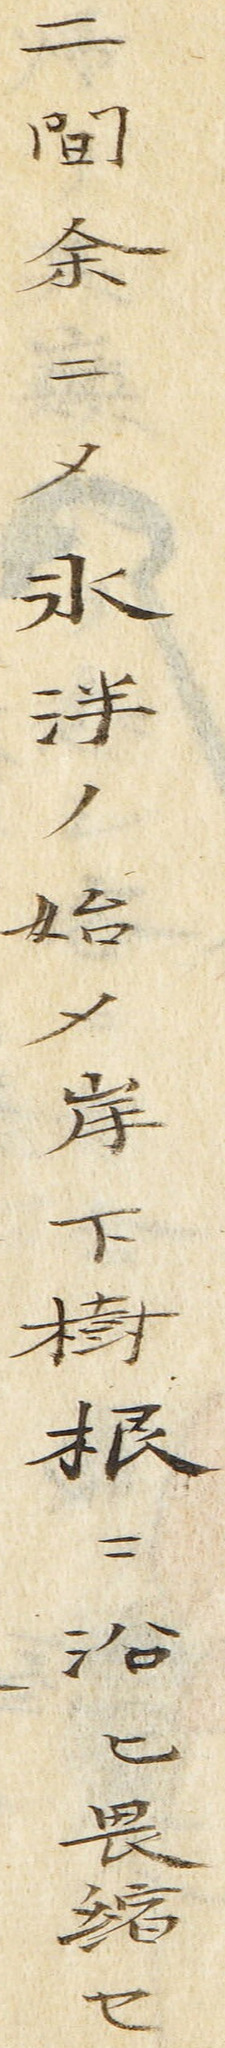二間余ニシテ氷洋ノ始シテ岸下樹根ニ沿ヒ畏縮セ
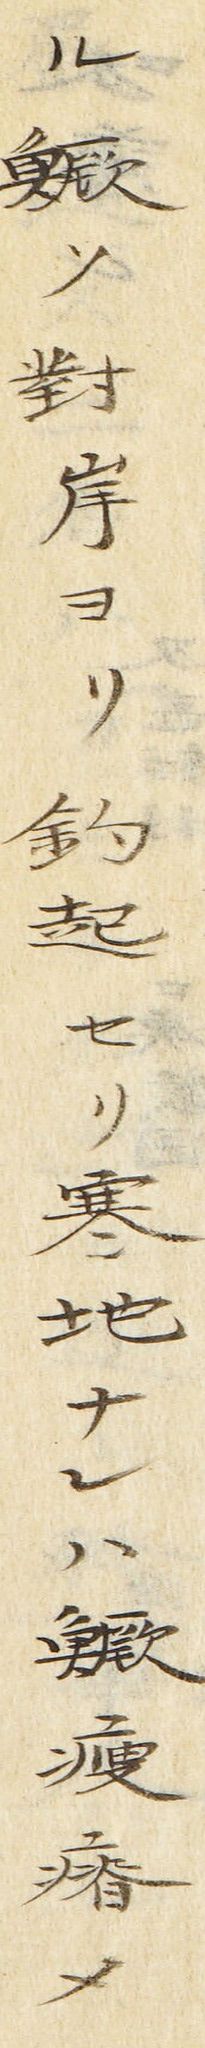ル鱖ソ対岸ヨリ釣起セリ寒地ナレハ鱖痩瘠シテ
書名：流蕃通書
